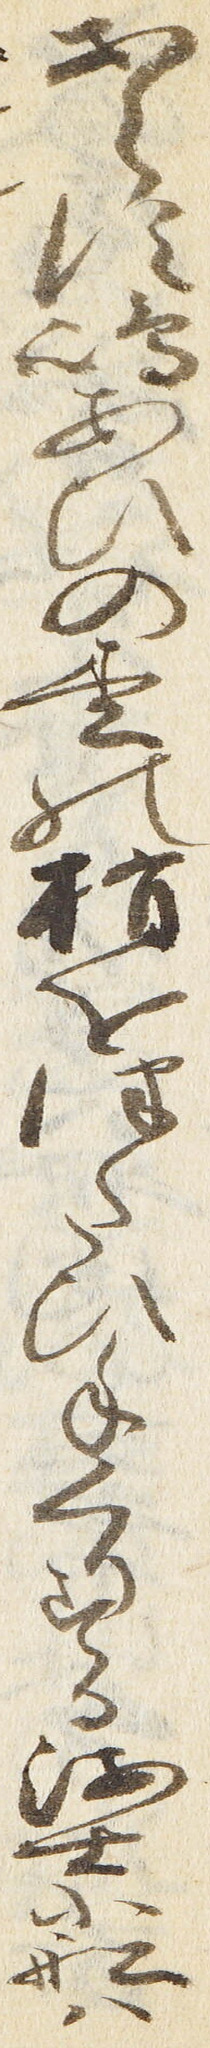あらす嶋あひの雲の梢をつたひ手くりする海士小船は
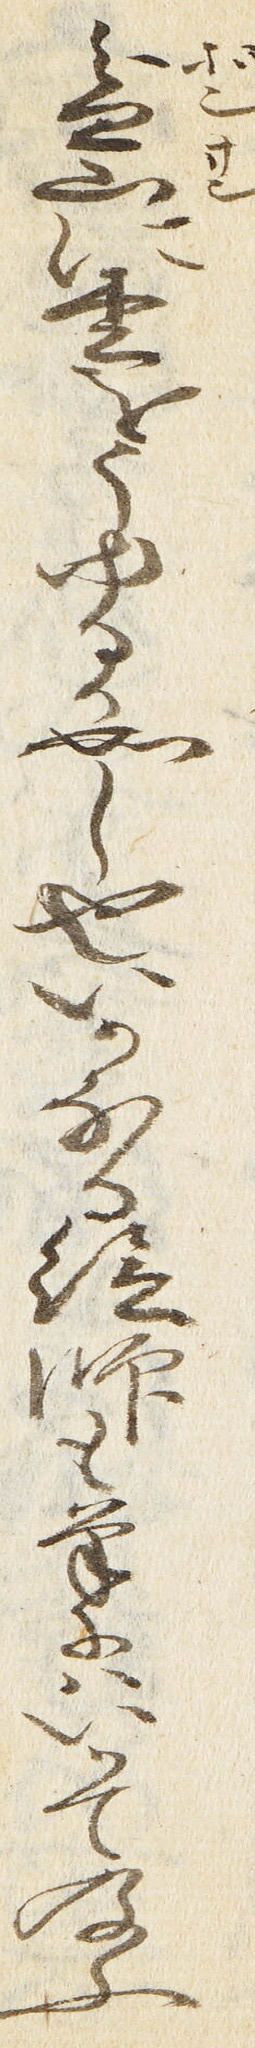盆山に雲をうゆるか如し也いかなる絵師も筆にはいかて及ふ
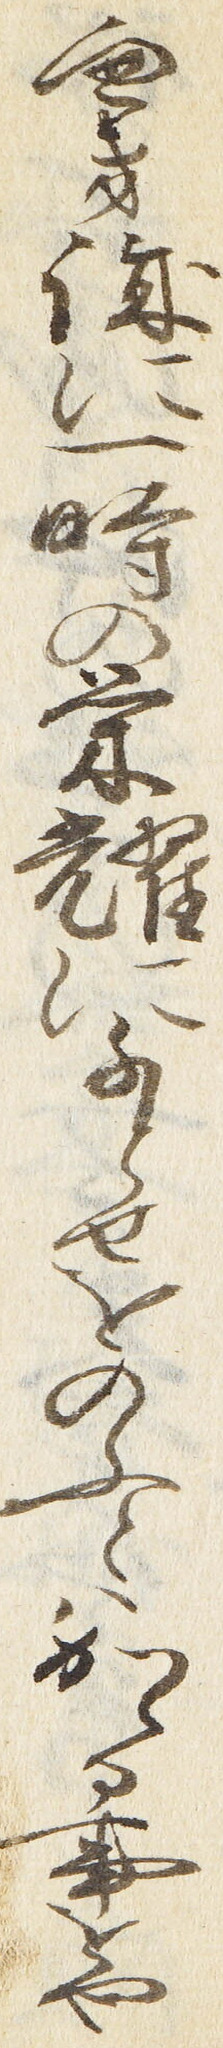へき誠に一時の栄耀に千とせをのふとはかゝる事をや
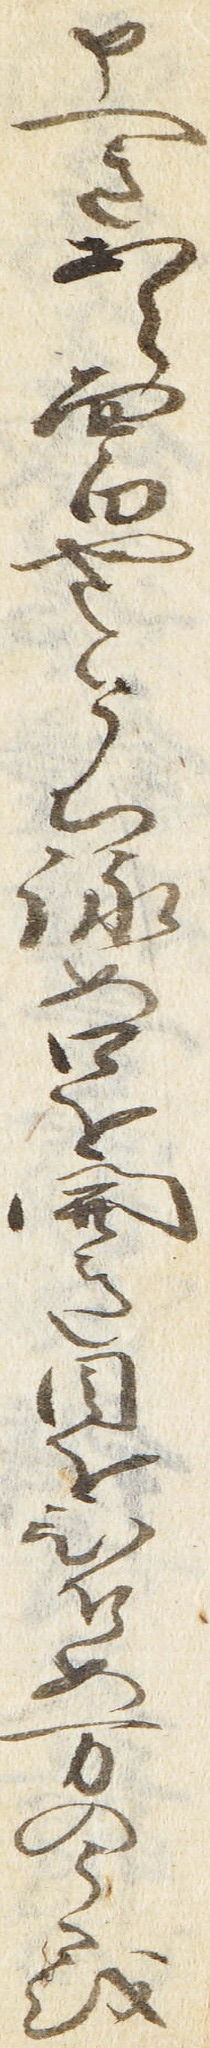申へきあら面白やとうち詠め口を開き目をひそめ万のうさを
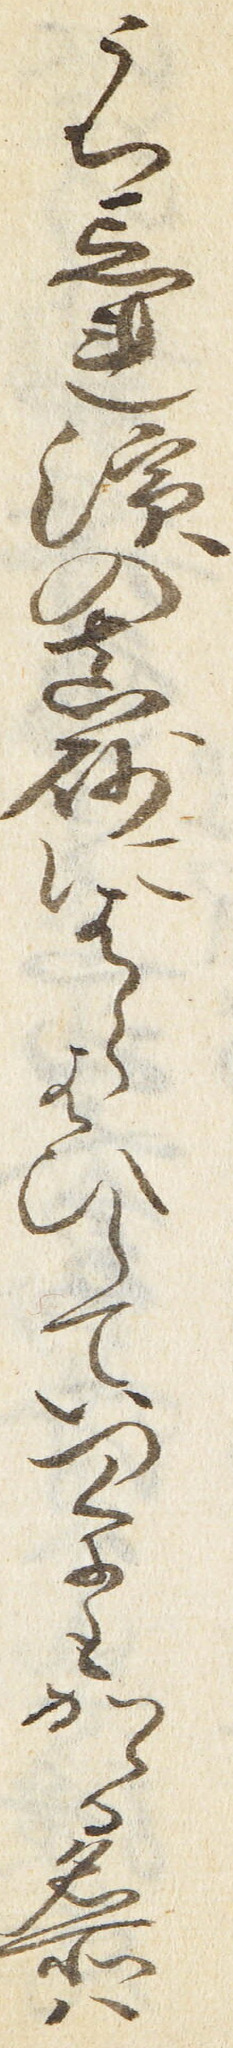うち忘れ浜の真砂にはらはひしていつくにもかゝる名所は
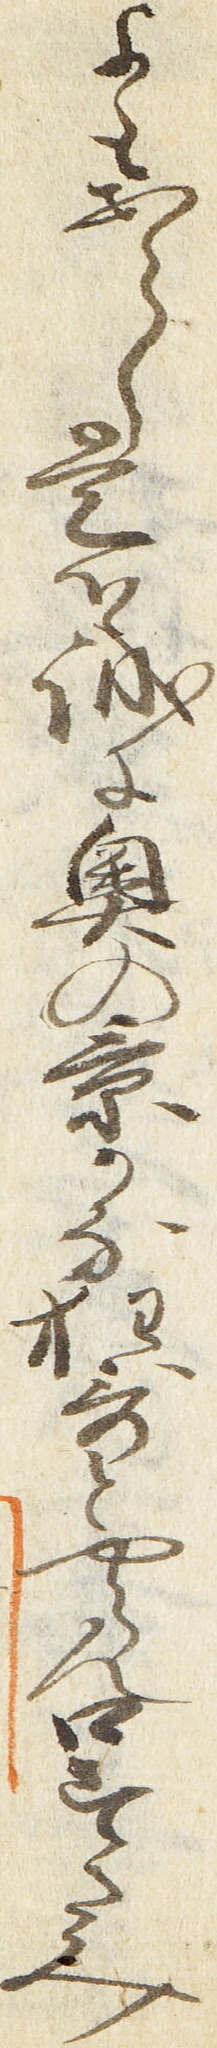よもあらし是そ誠に奥の京かな狂歌とやらん口すさみ

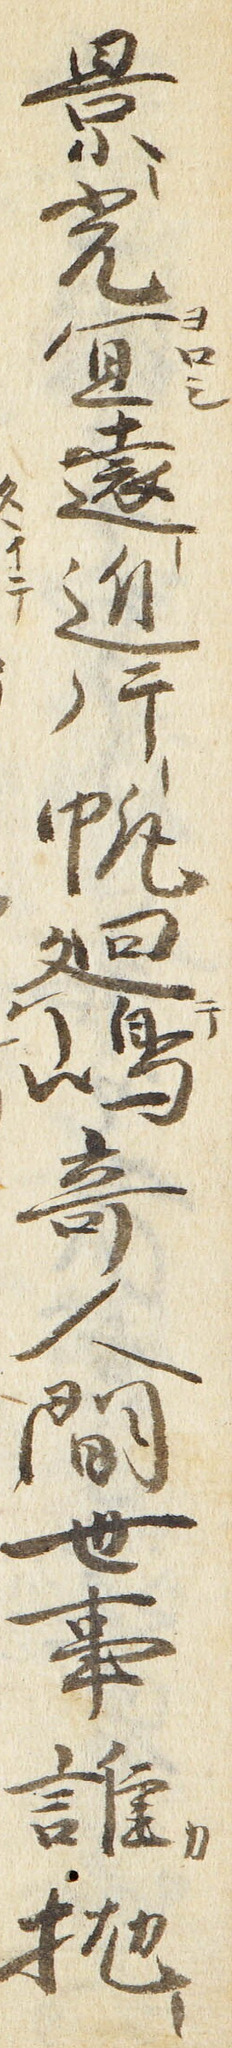景光宜遠近片帆廻嶋奇人間世事誰カ抛
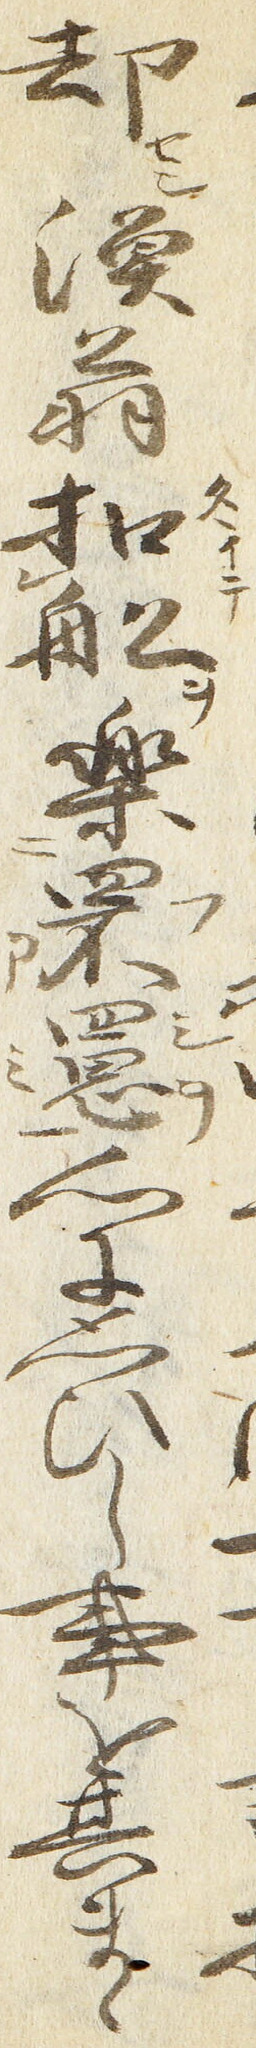却セン漁翁扣船ヲ楽罘心に思ひし事を其まゝ
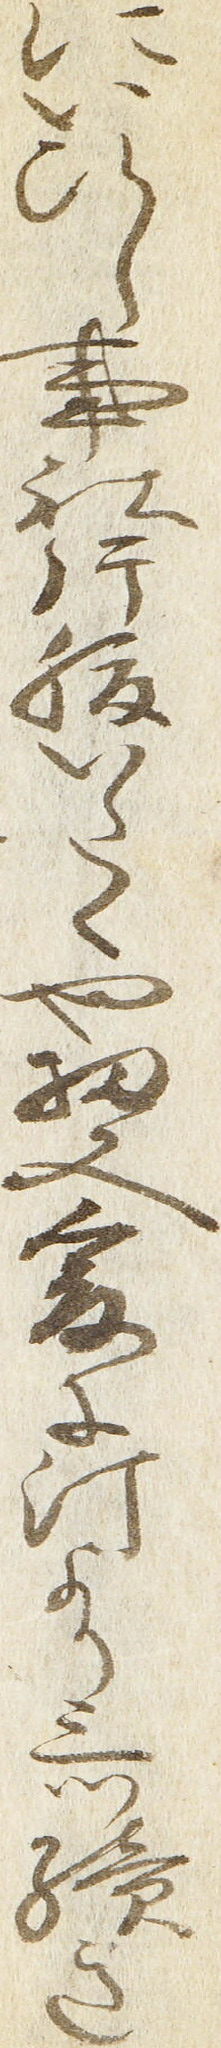にいひし事社片腹いたくや扨又爰に汀より三ツ続き
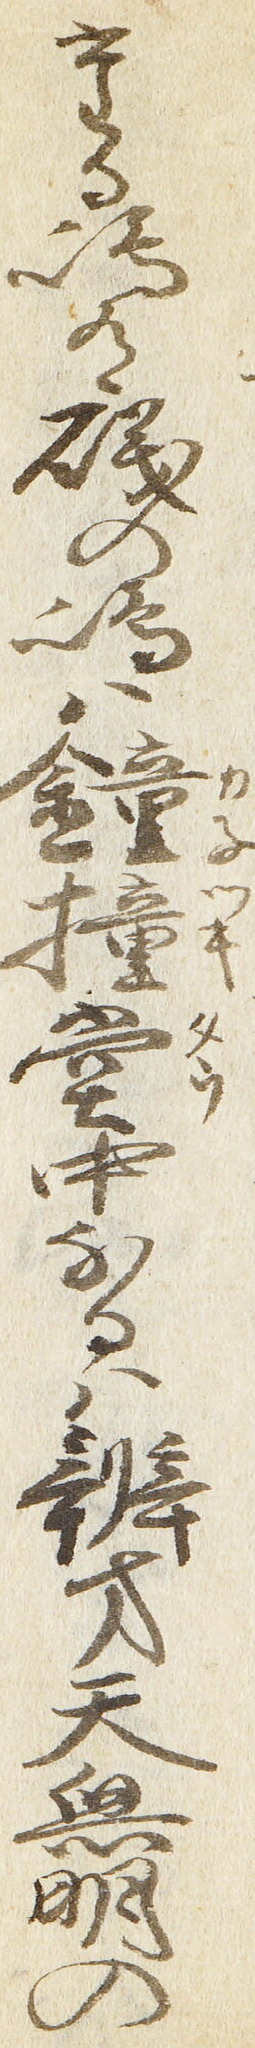たる嶋有磯の嶋ハ鐘撞堂中なるハ弁才天興明の
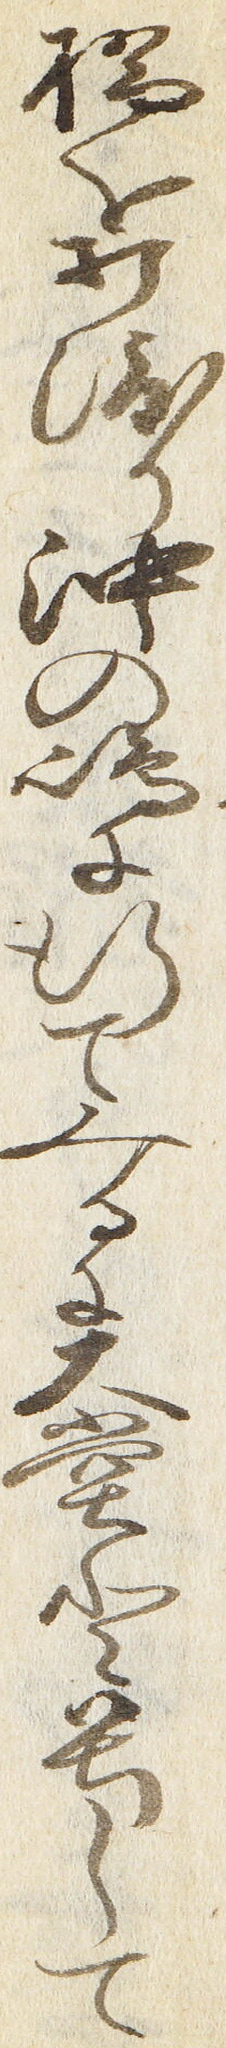橋を打渡り沖の嶋に行てみるに大堂と号して
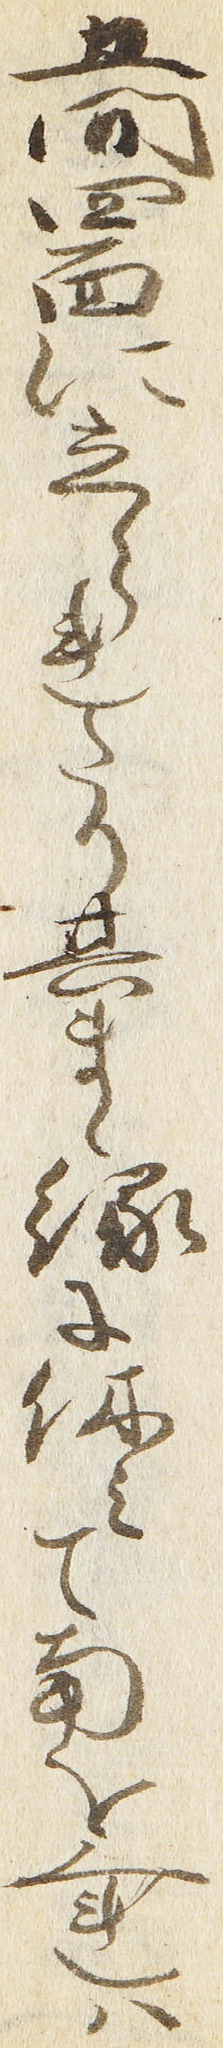五間四面に立られたり其まゝ縁に休みて南をみれは
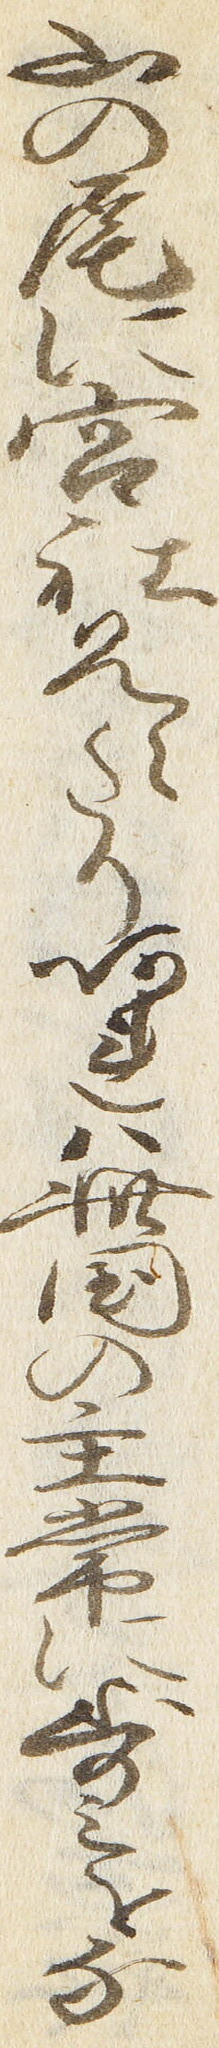山の尾に宮社みえたりあれは此国の主常に歩みをな
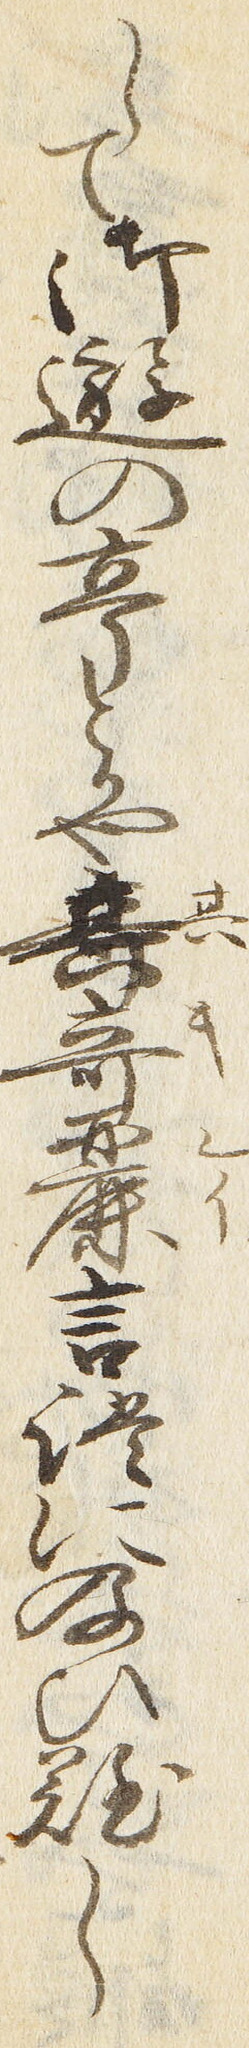して御遊の亭とかや其奇麗言語に及ひ難し
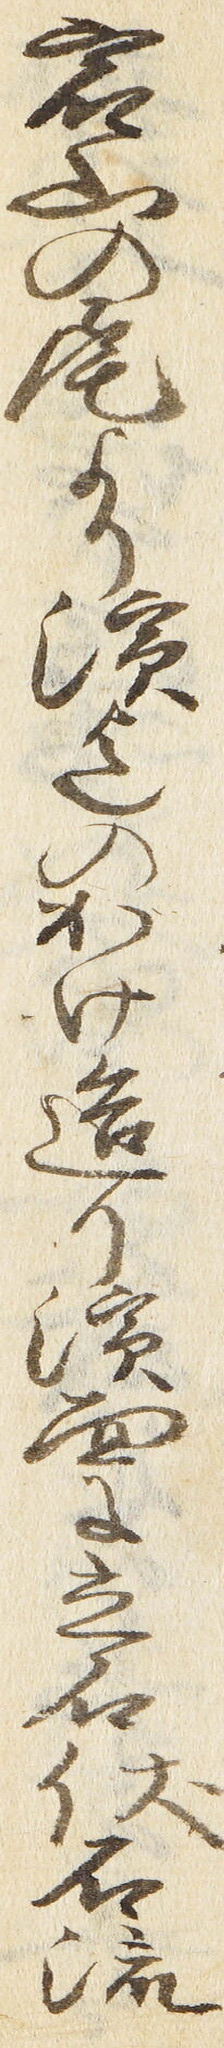岩山の尾より浜迄のかけ造り浜面に立石伏石流
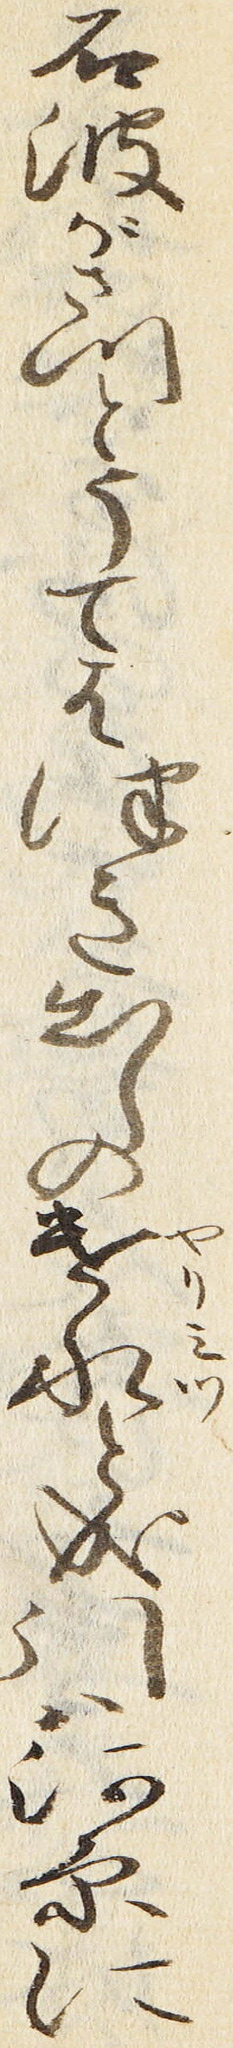石波がさつとうてはつき出しの遣水と成引は河原に
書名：海陸世話日記
